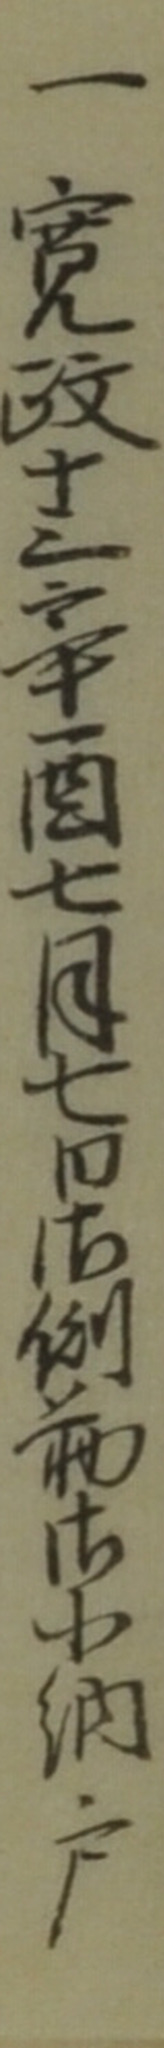一寛政十三辛酉七月七日御側勤御小納戸
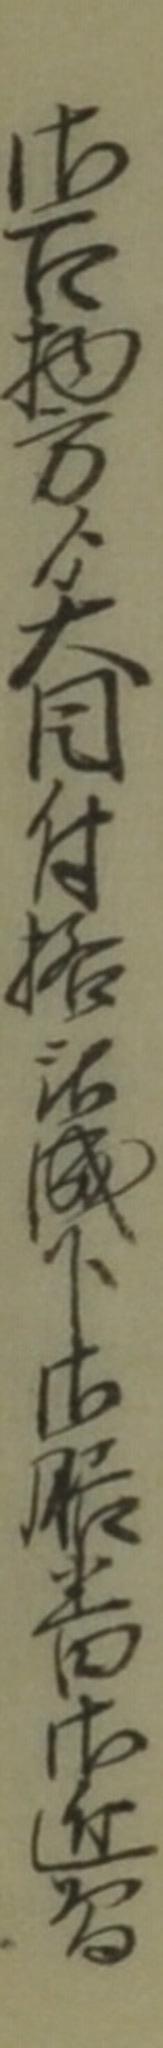御召物方ゟ大目付格被成下御膳番御近習
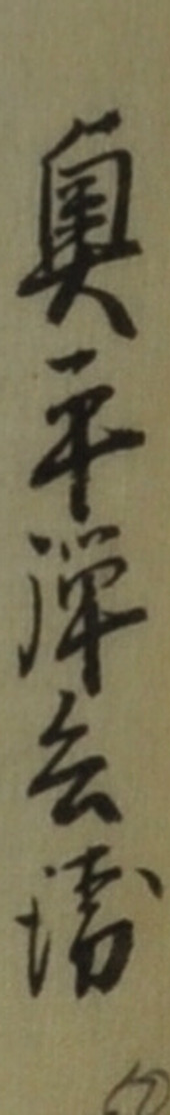奥平弾兵衛
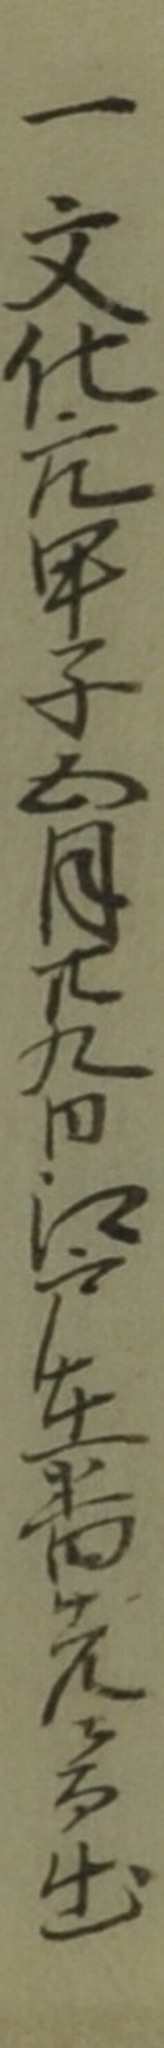一文化元甲子五月廿九日江戸在番先ニ而出
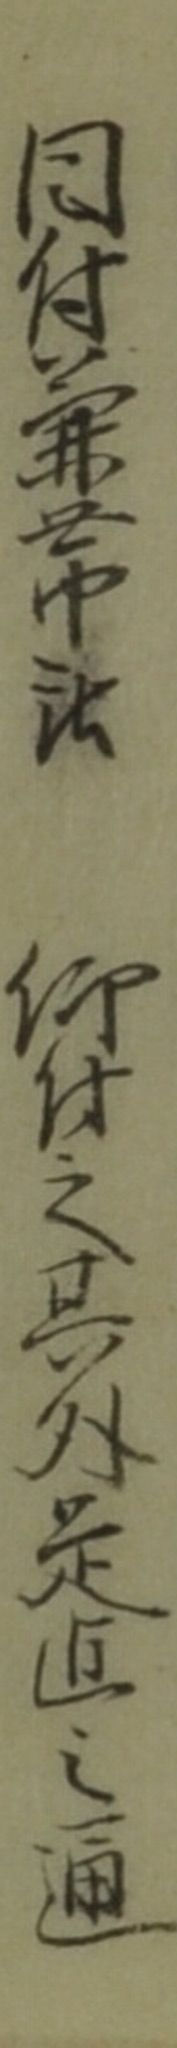目付兼帯被仰付之其外是迄之通
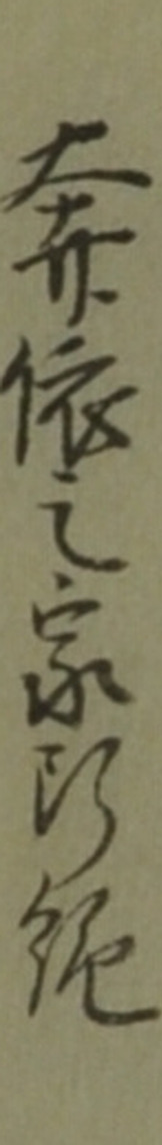奔依之家断絶
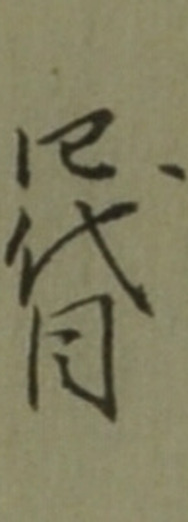四代目
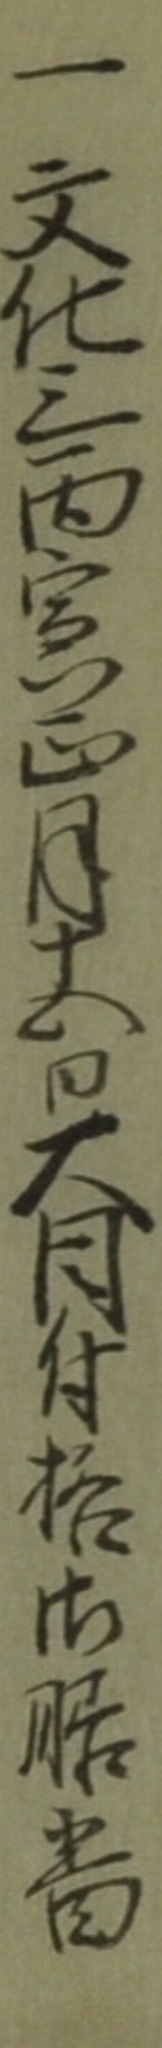一文化三丙寅正月十五日大目付格御膳番
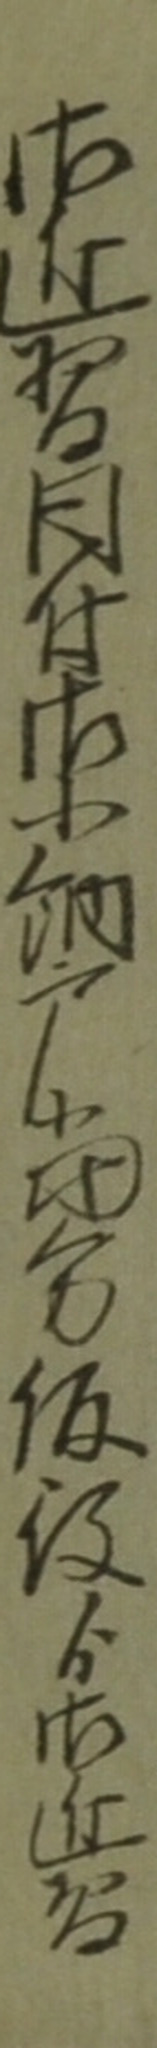御近習目付御小納戸当分仮役ゟ御近習
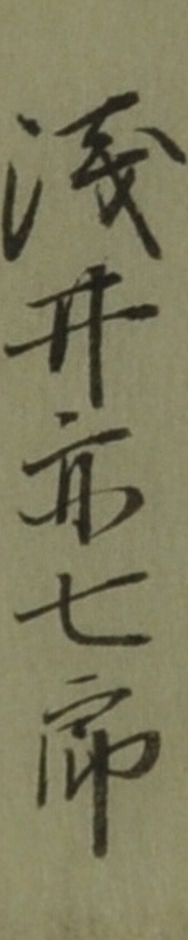浅井亦七郎
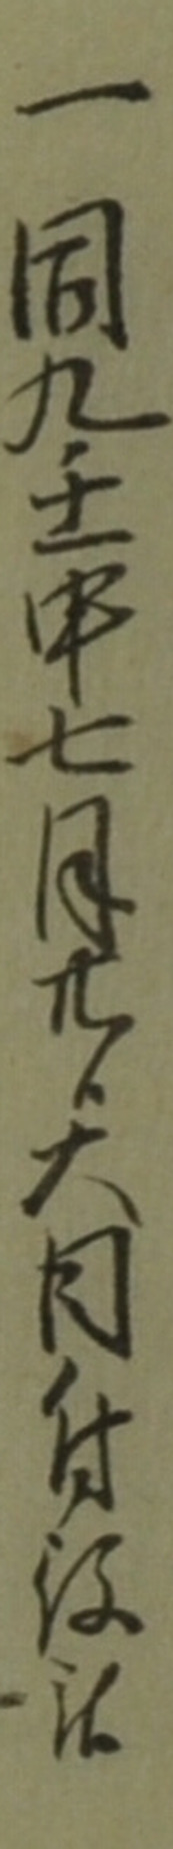一同九壬申七月廿日大目付役被
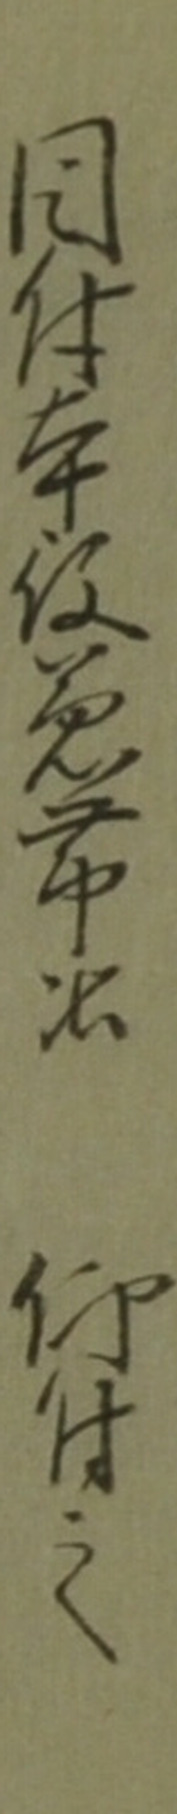目付本役兼帯被仰付之
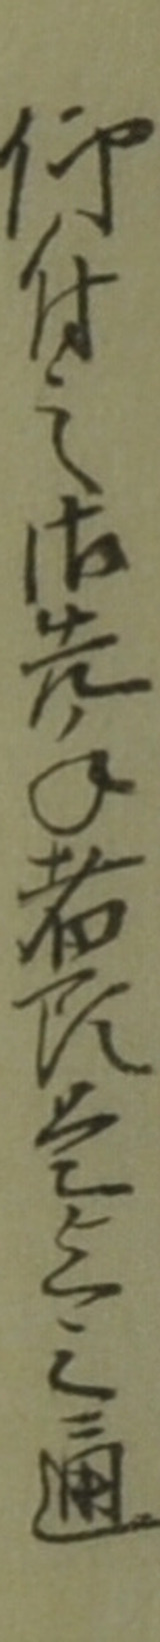仰付之御先手者頭是迄之通

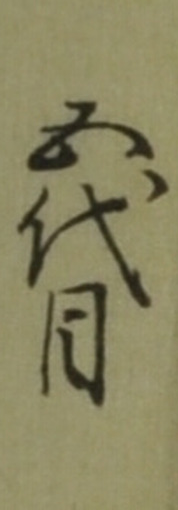五代目
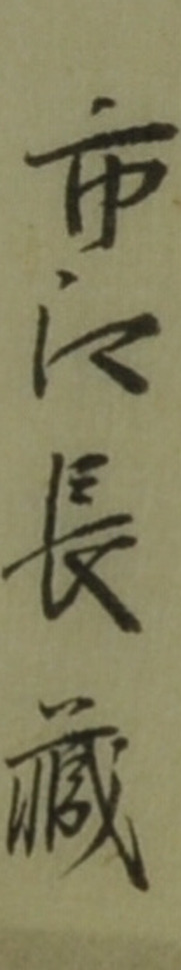市江長蔵
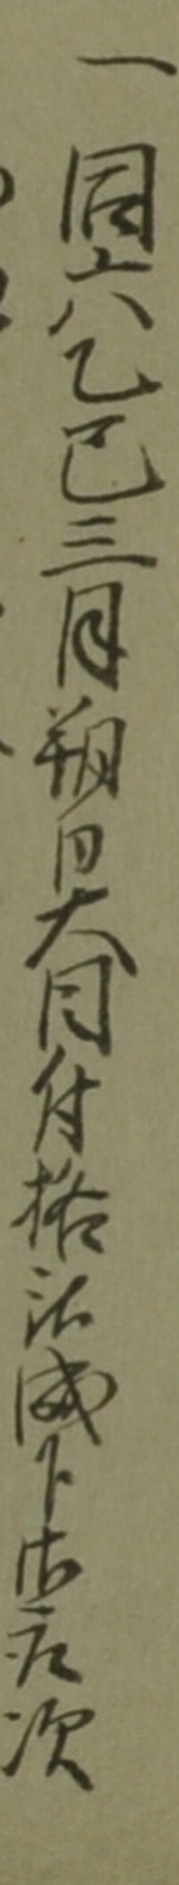一同六乙巳三月朔日大目付格被成下御取次
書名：諸御役代々録（四）
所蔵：伊那市立高遠町図書館・合同会社AMANE
